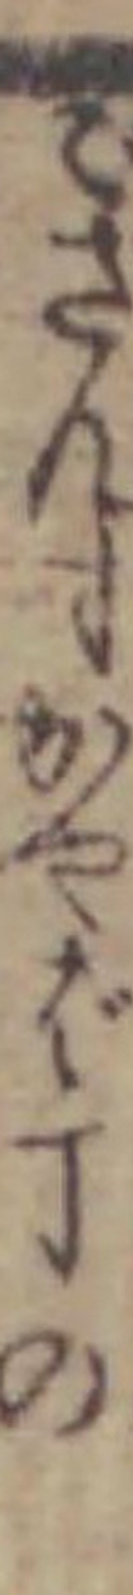ござんすかやば丁の
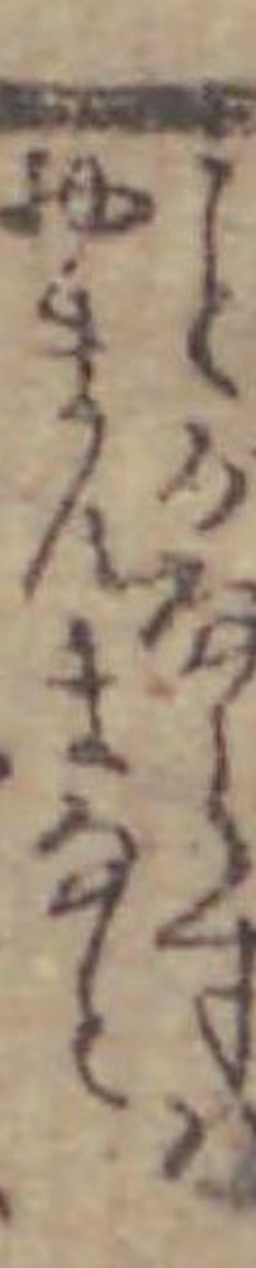おまんまなと
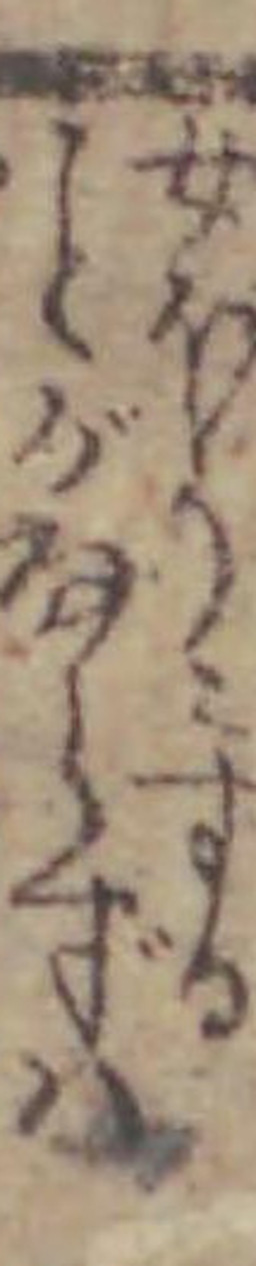ことがならずは
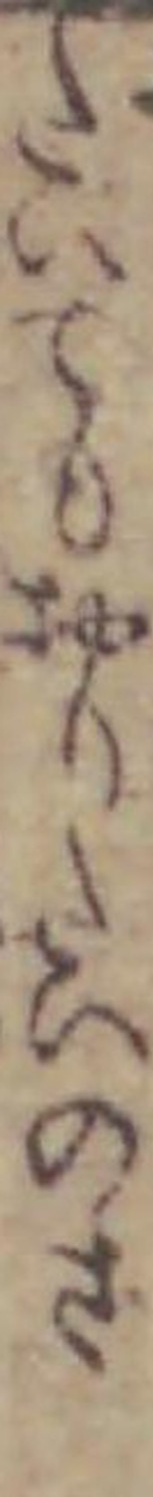たいてもおりたいのさ

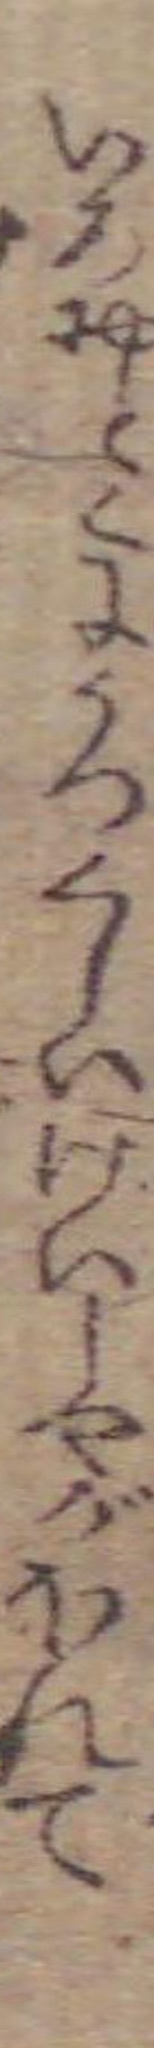いろおとこにうつくしいげいしやがほれて
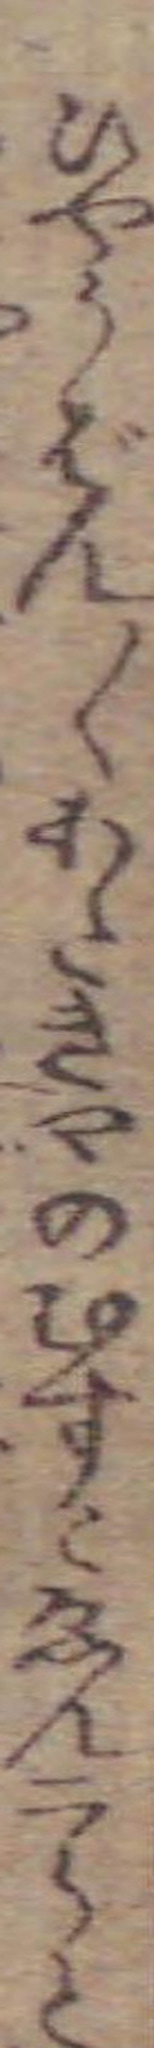ひやうばん〳〵あたきやのむすこゑん二郎といふ
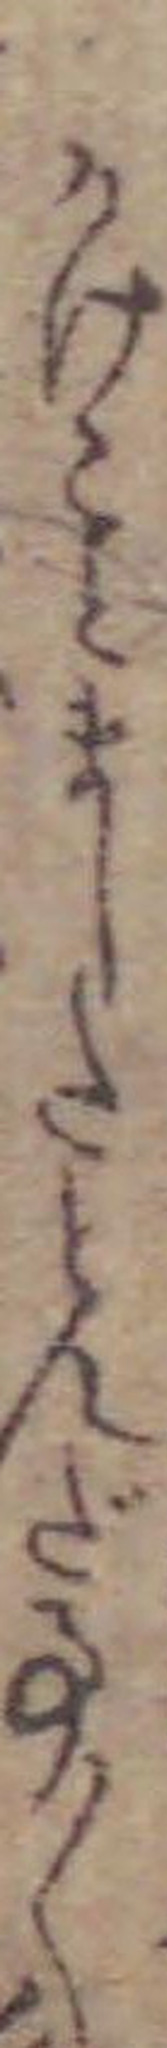かけことましたとんだ事〳〵
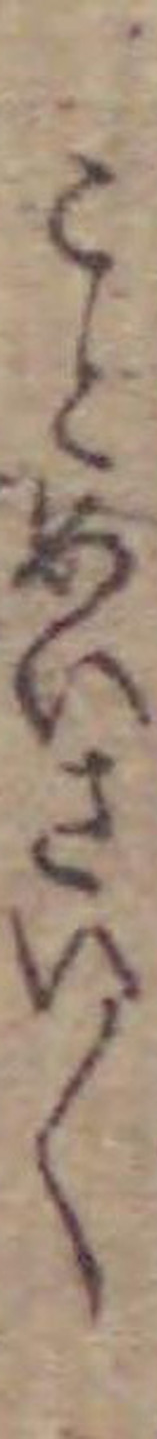ことめいさい〳〵
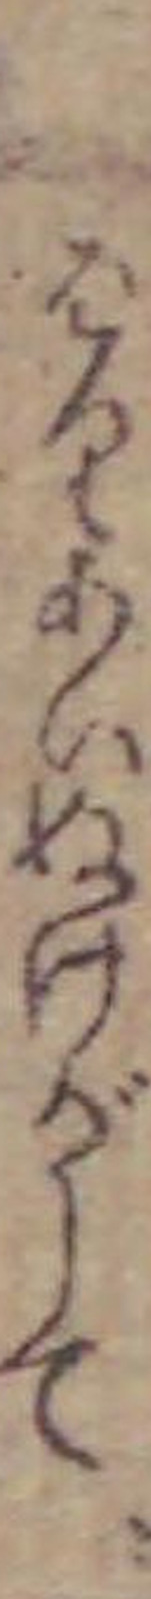はりあいぬけがして
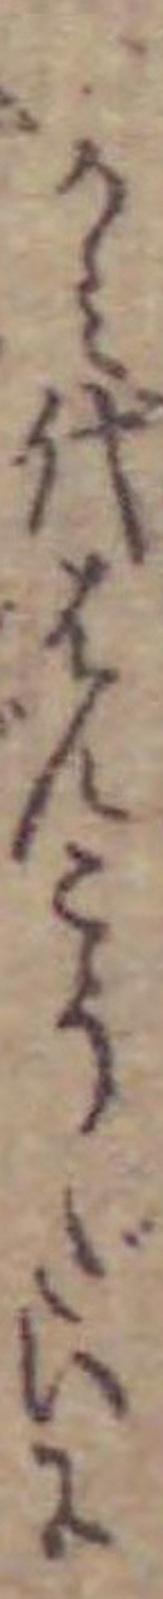かみ代はんこうだいに
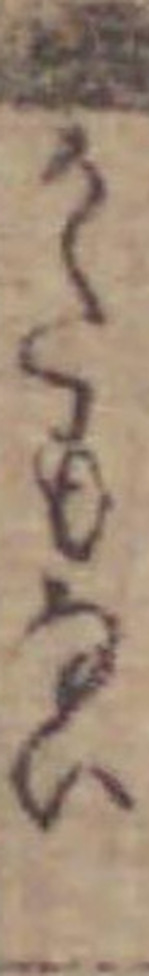かたもない
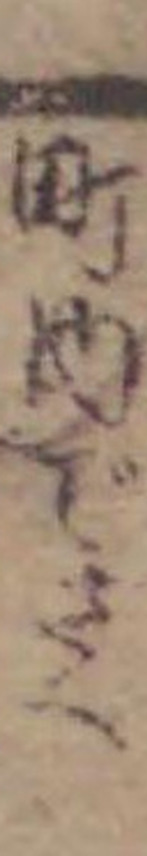町内でさへ
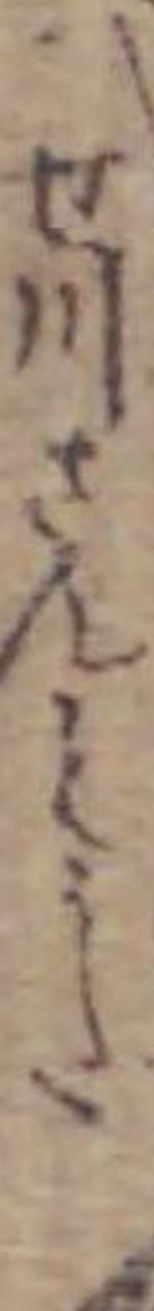女〽せ川さんとうた
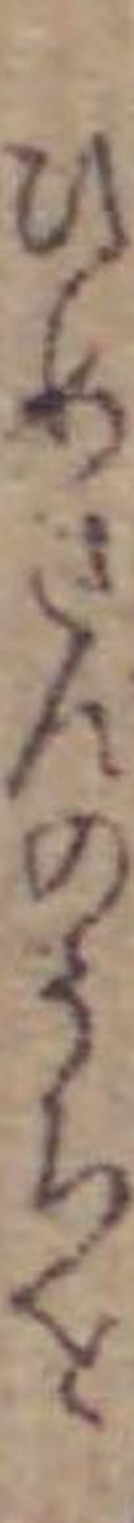ひめさんのうちを
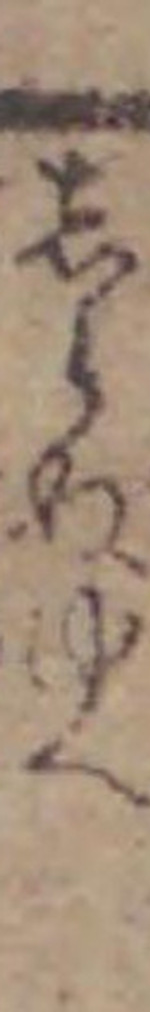しらぬゆへ
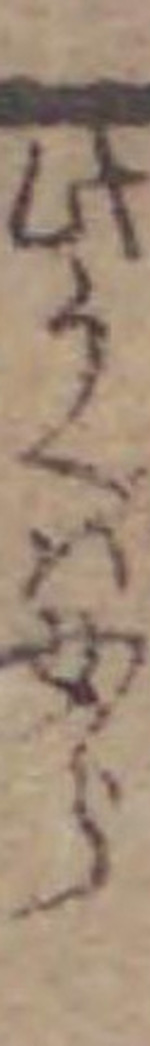此うへは女郎
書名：江戸生艶気樺焼 : 3巻
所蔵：国立国会図書館 National Diet Library, JAPAN
